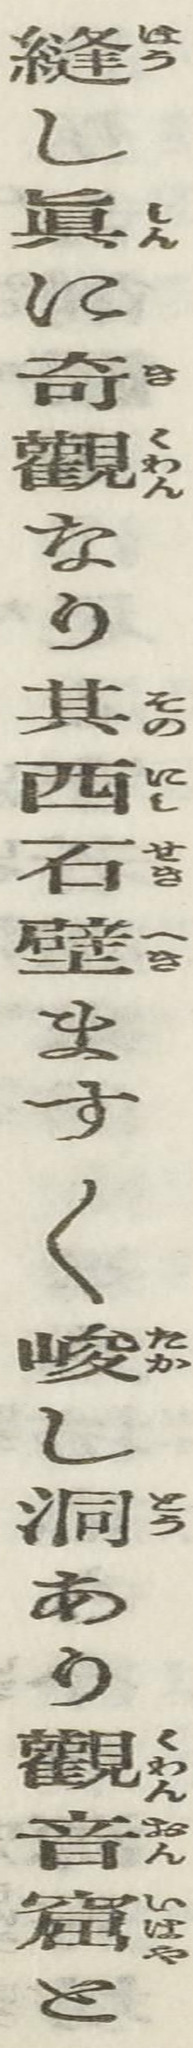縫し眞に奇観なり其西石壁ます〳〵峻し洞あり観音窟と
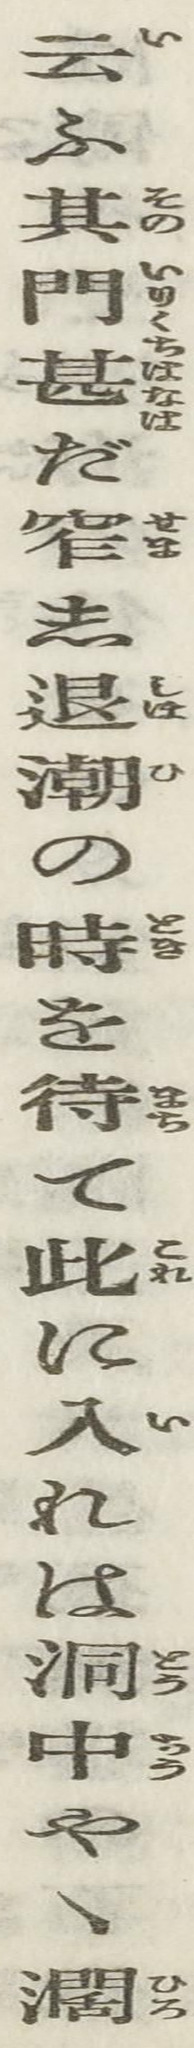云ふ其門甚だ窄し退潮の時を待て此に入れは洞中やゝ濶
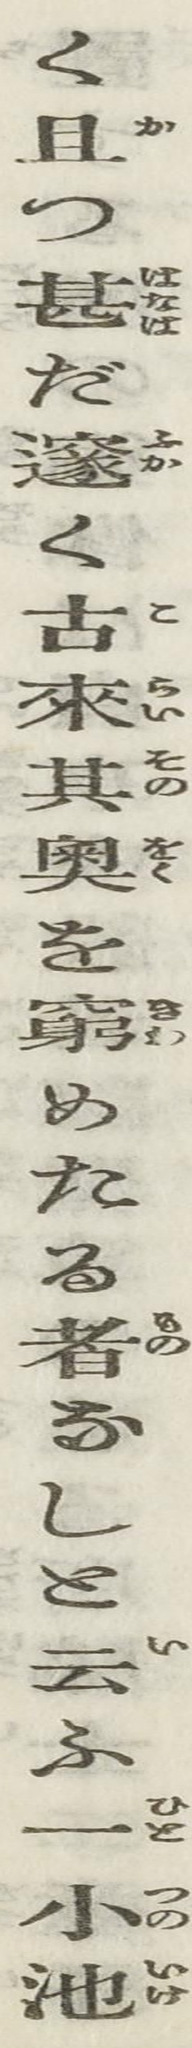く且つ甚だ邃く古来其奥を窮めたる者なしと云ふ一小池
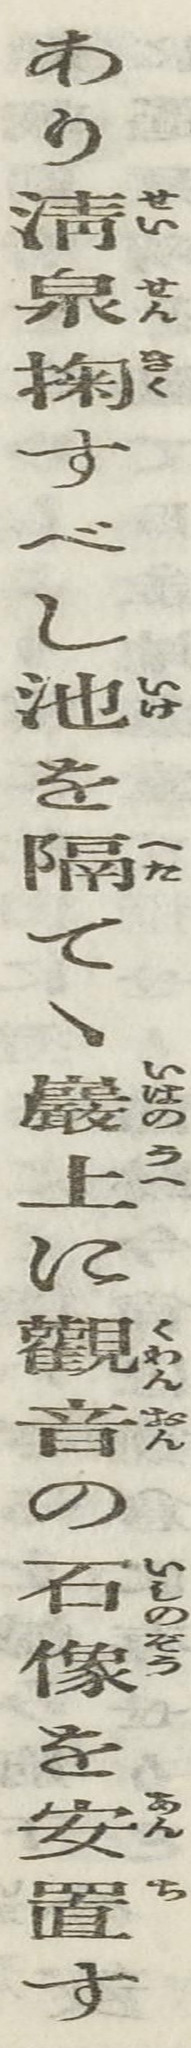あり清泉掬すべし池を隔てヽ巖上に観音の石像を安置す
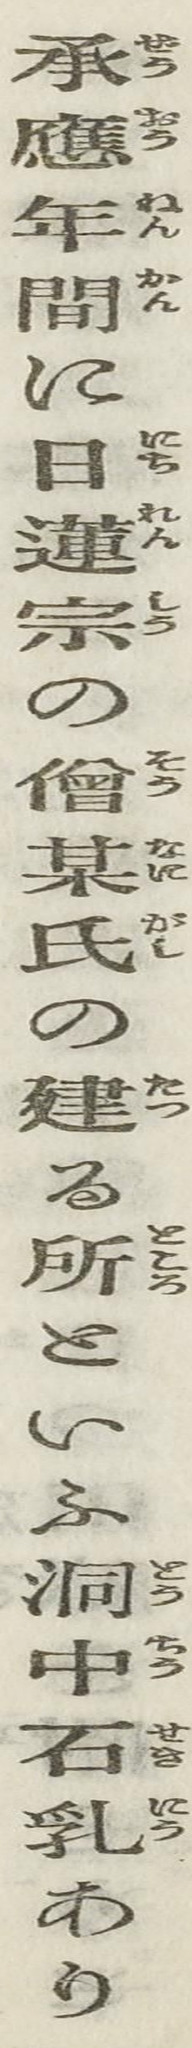承応年間に日蓮宗の僧何某の建る所といふ洞中石乳あり
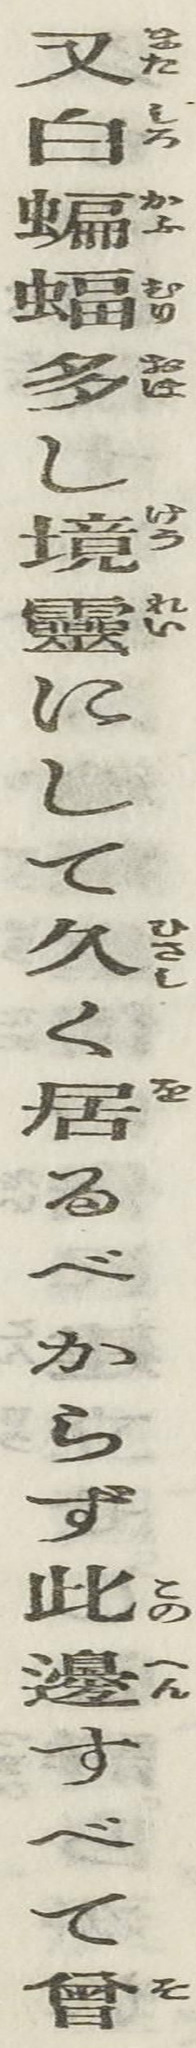又白蝙蝠多し境霊にして久く居るべからず此邊すべて曽
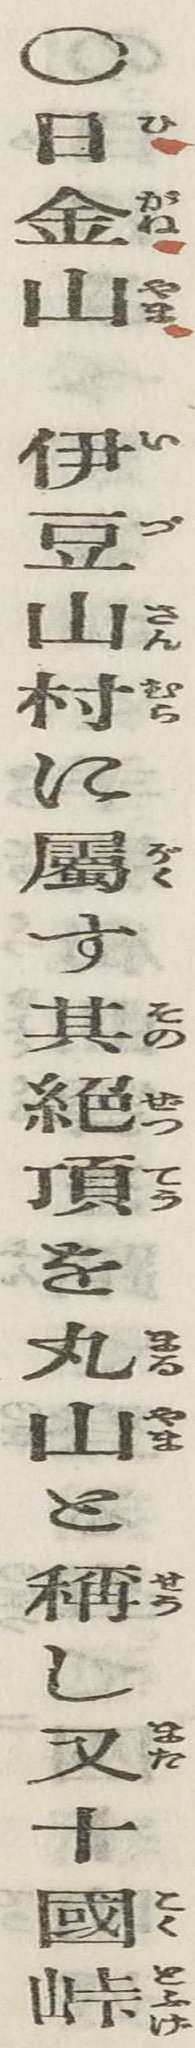○日金山伊豆山村に属す其絶頂を丸山と称し又十國峠
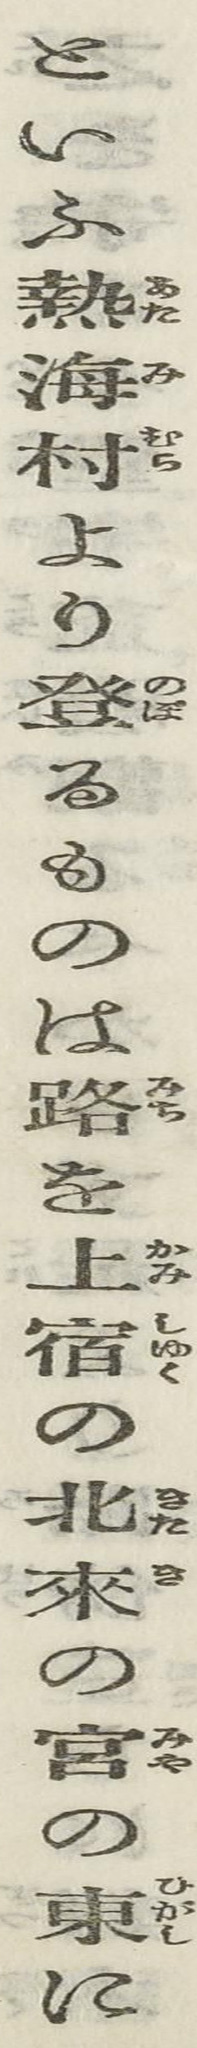といふ熱海村より登るものは路を上宿の北来の宮の東に
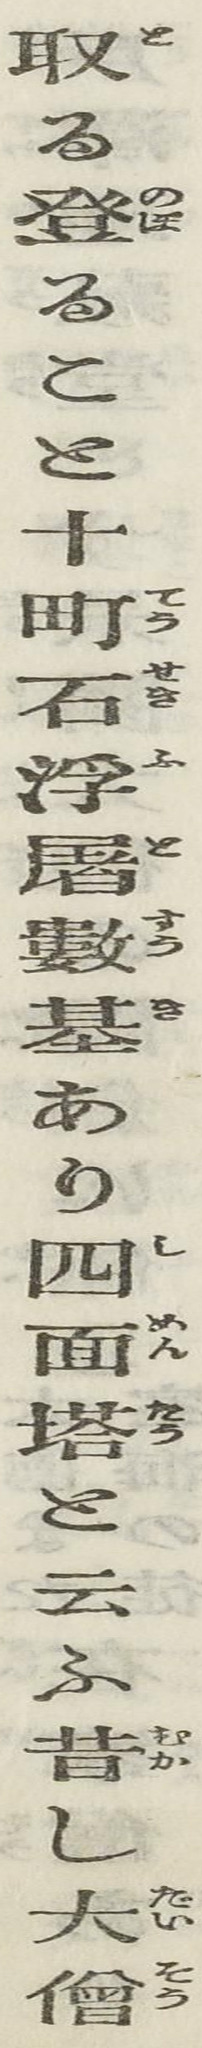取る登ること十町石浮屠数基あり四面塔と云ふ昔し大僧

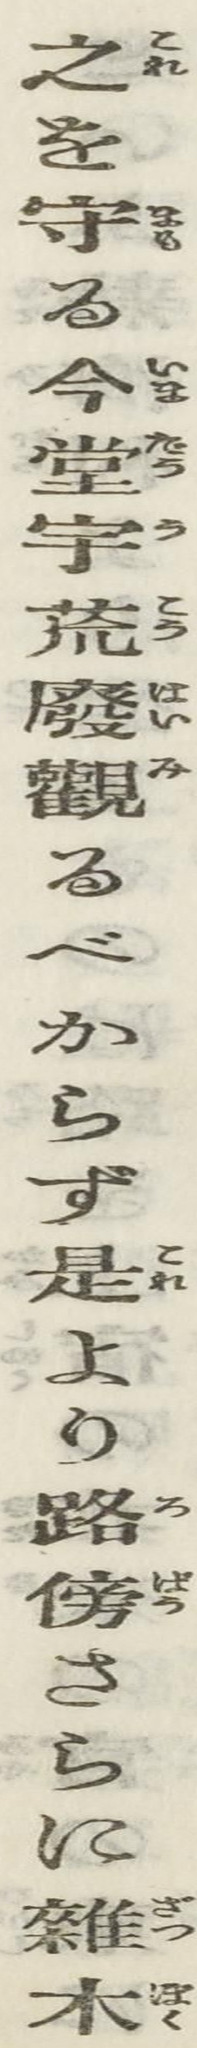之を守る今堂宇荒廃観るべからず是より路傍さらに雑木
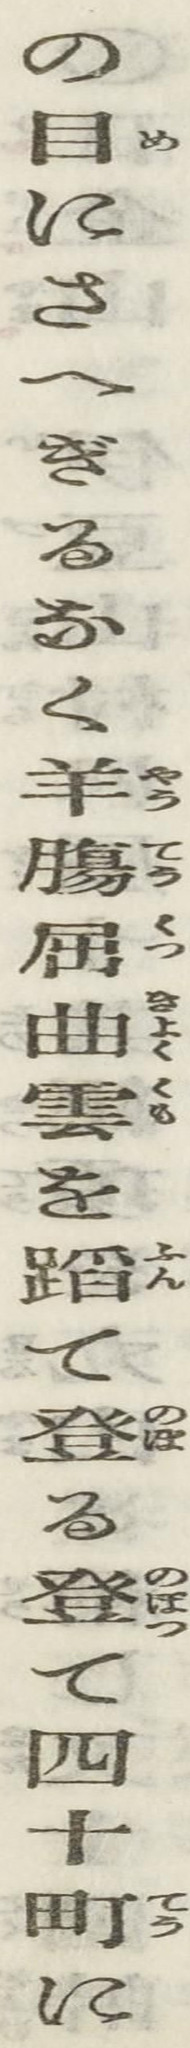の目にさへぎるなく羊腸屈曲雲を踏て登る登て四十町に
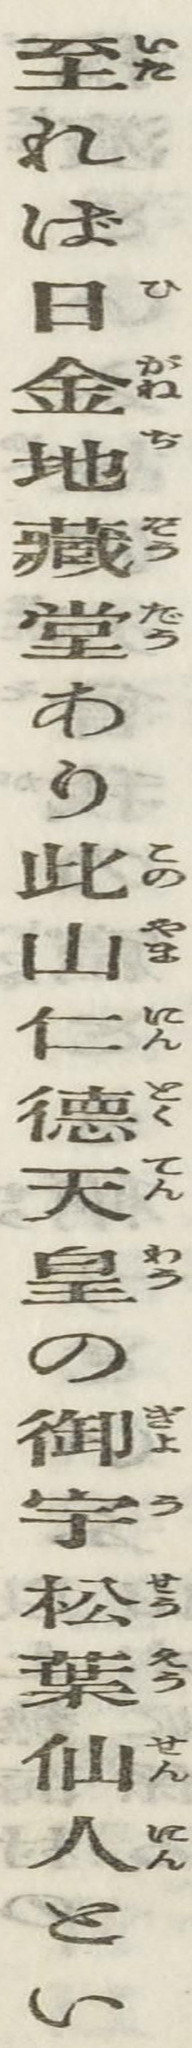至れば日金地蔵あり此山仁徳天皇の御宇松葉仙人とい
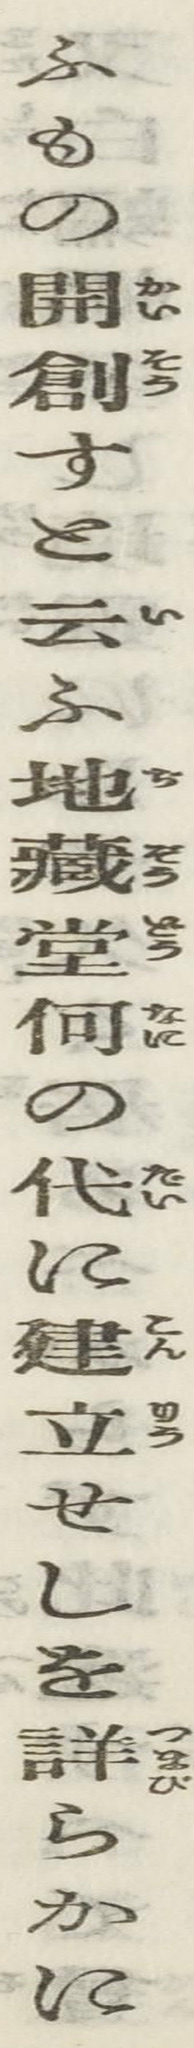ふもの開創すと云ふ地蔵堂何の代に建立せしを詳らかに
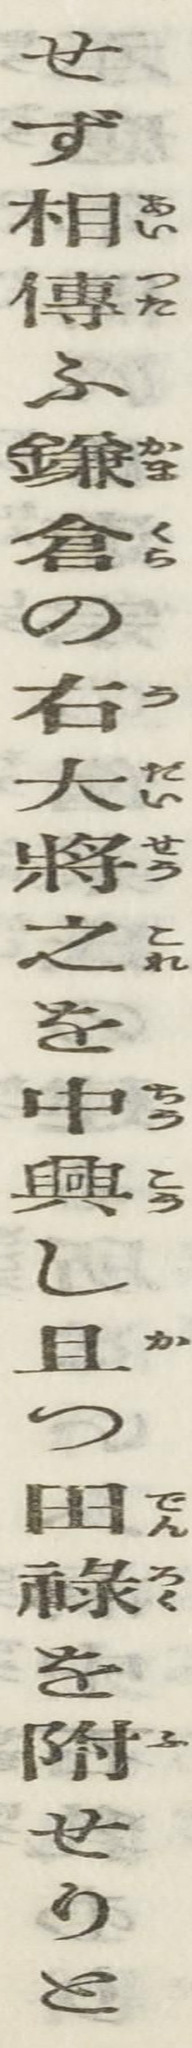せず相伝ふ鎌倉の右大将之を中興し且つ田禄を附せりと
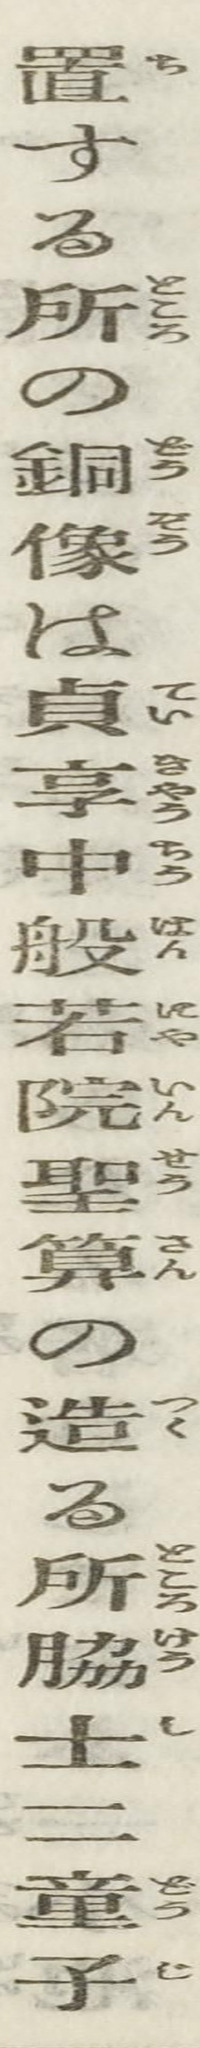置する所の銅像は貞享中般若院聖算の造る所脇士二童子
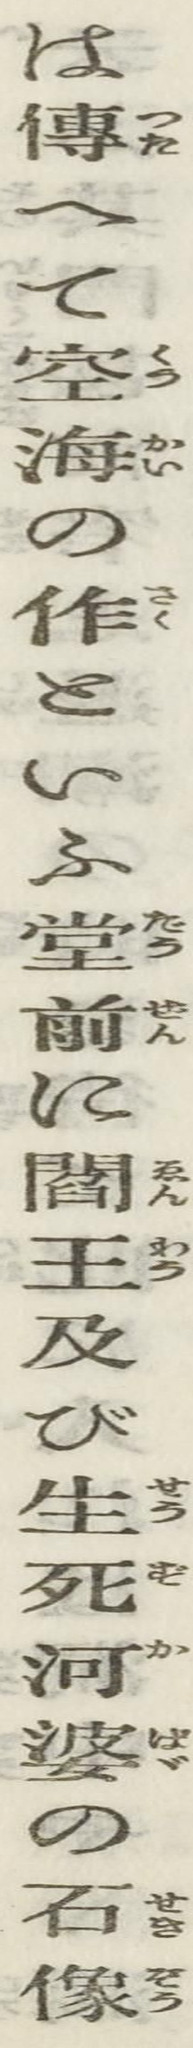は伝へて空海の作といふ堂前に閻王及び生死河婆の石像
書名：熱海獨案内　全
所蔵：東京大学地震研究所図書室 Earthquake Research Institute Library, The University of Tokyo, JAPAN
